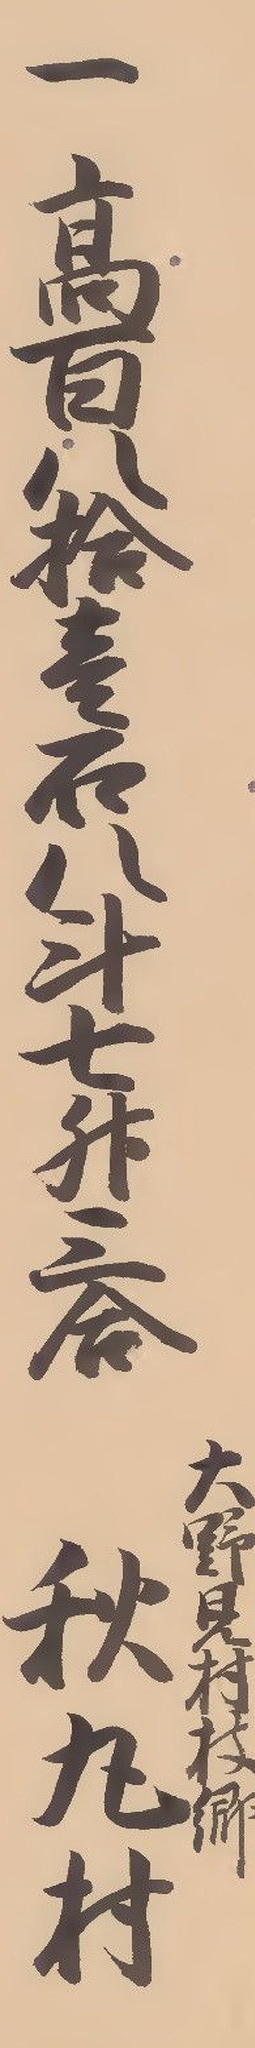一髙百八拾壱石八斗七升三合秋丸村
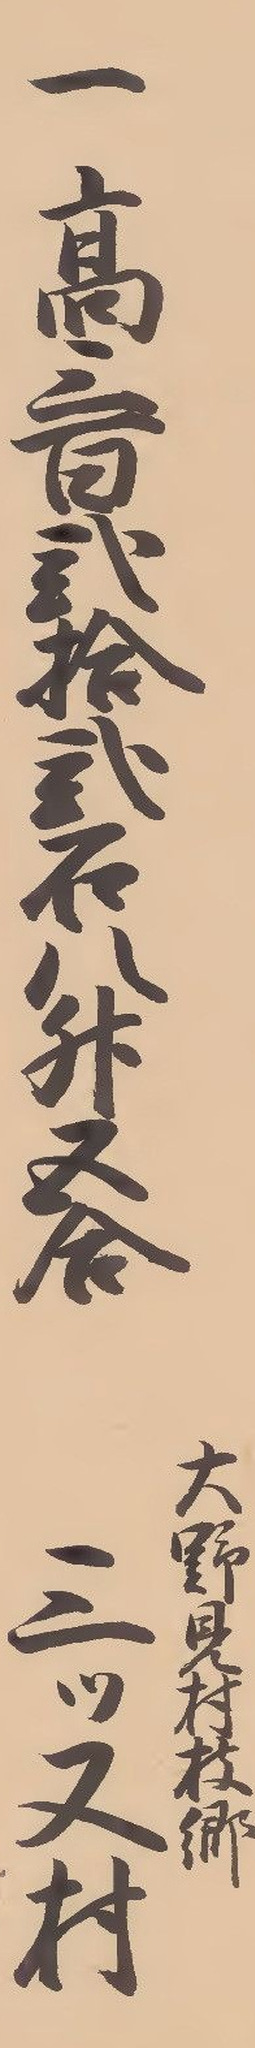一髙三百弐拾弐石八升五合三ツ又村
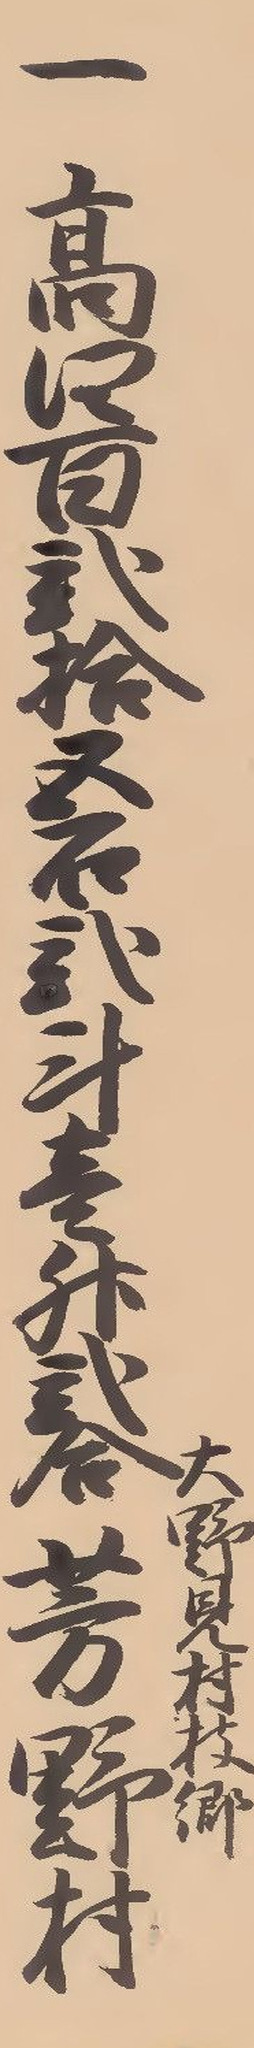一髙四百弐拾五石弐斗壱升弐合芳野村
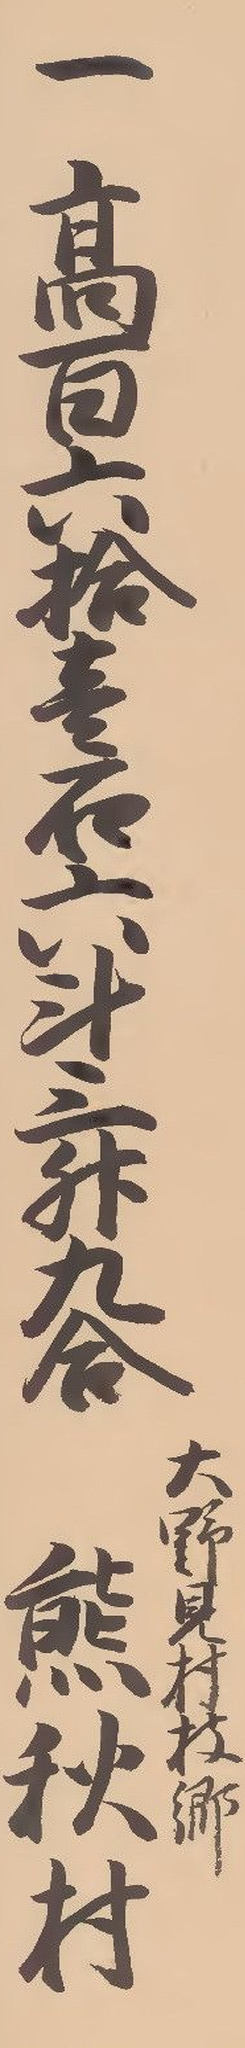一髙百六拾壱石六斗三升九合熊秋村
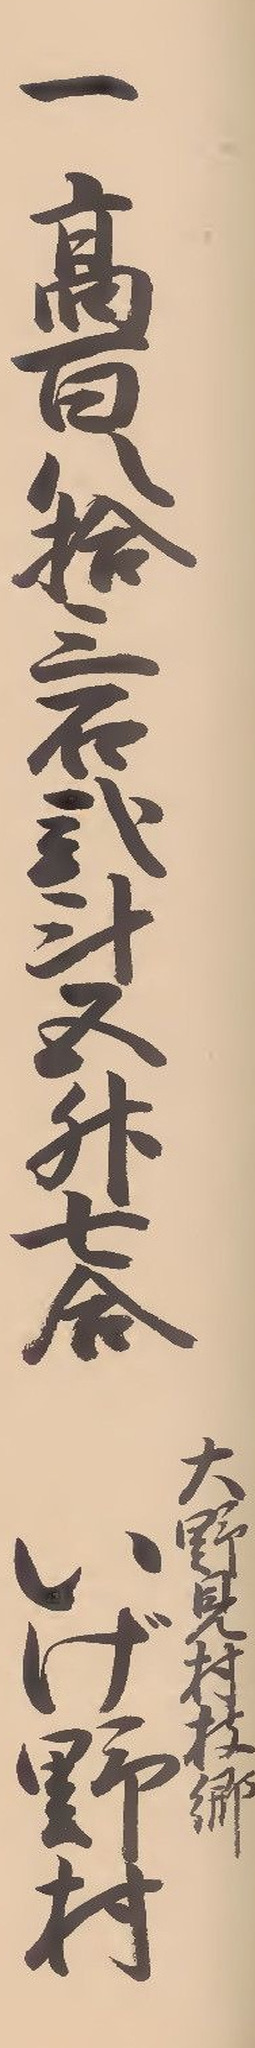一髙百八拾三石弐斗五升七合いげ野村
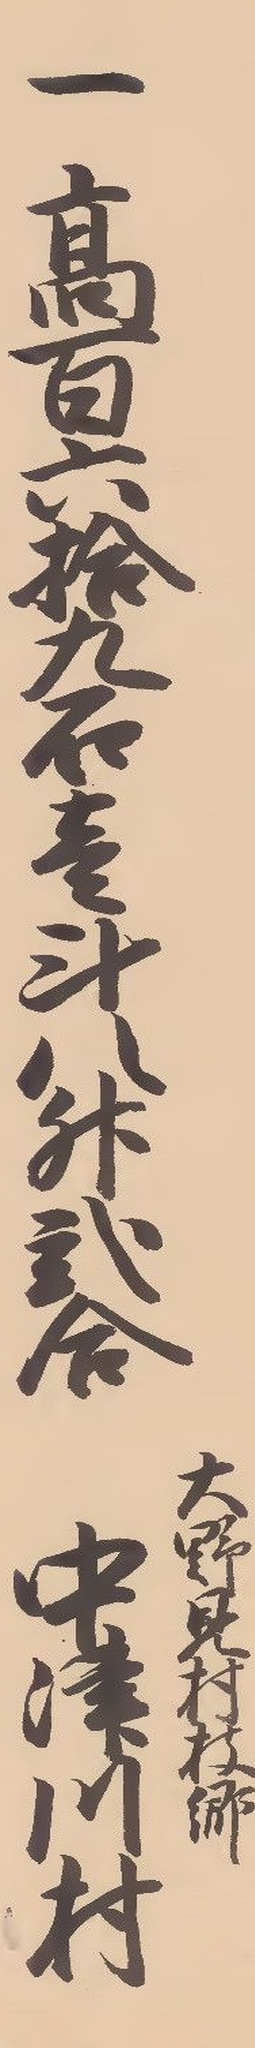一髙百六拾九石壱斗八升弐合中津川村
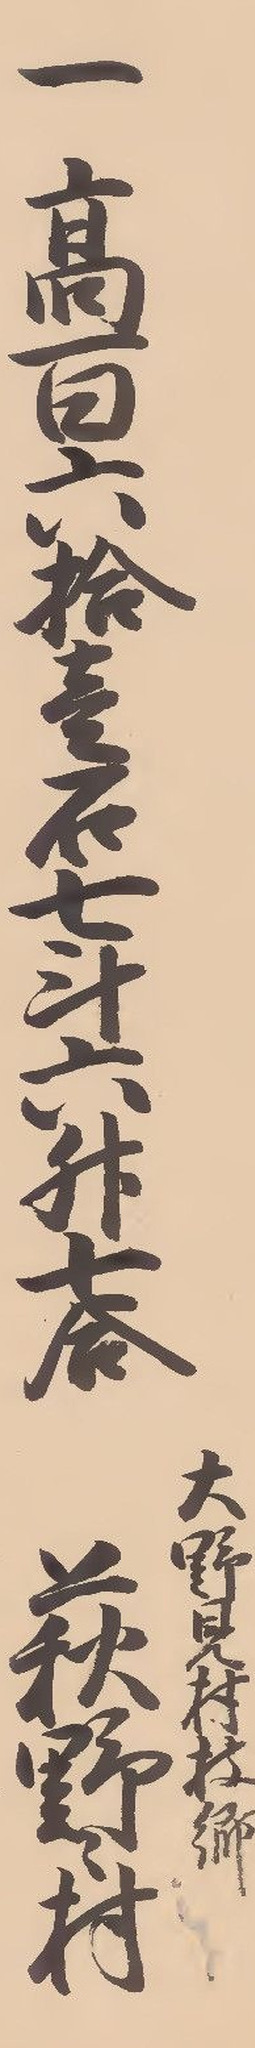一髙百六拾壱石七斗六升七合萩野村
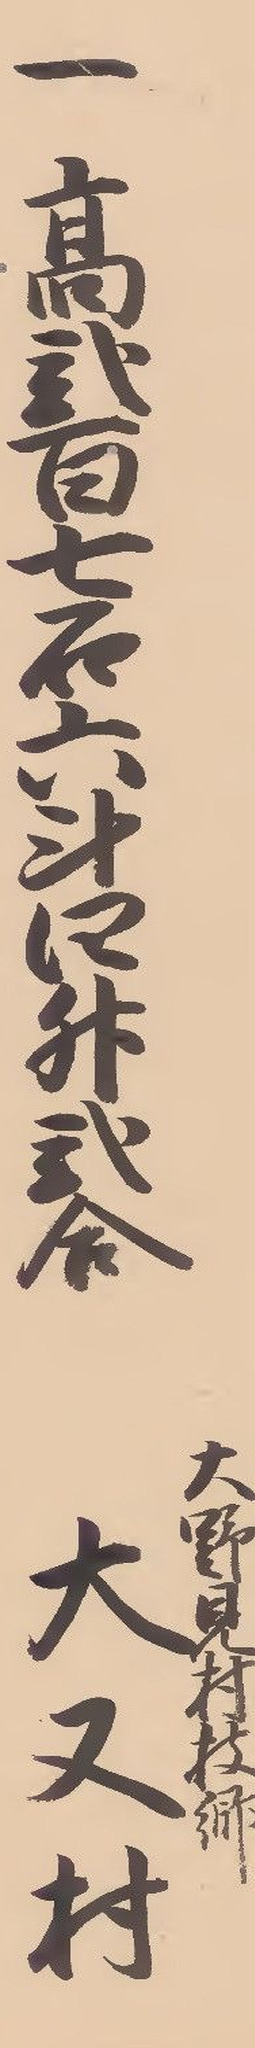一髙弐百七石六斗四升弐合大又村

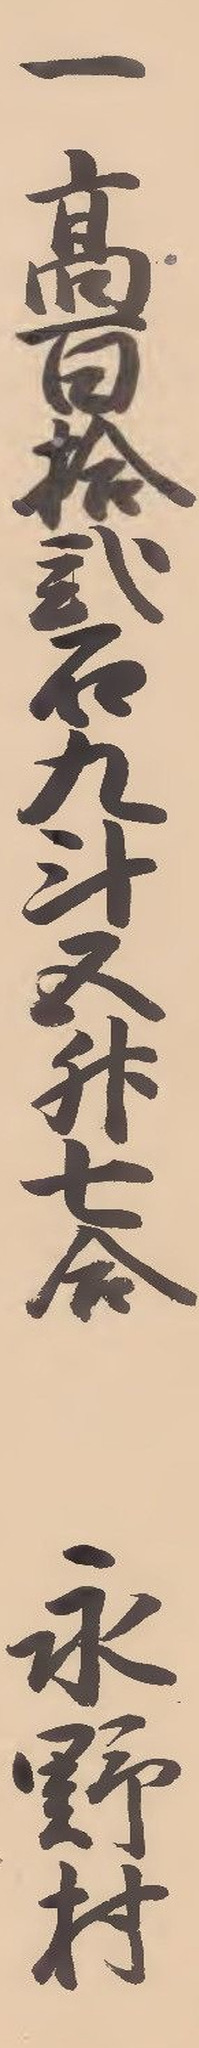一髙百拾弐石九斗五升七合永野村
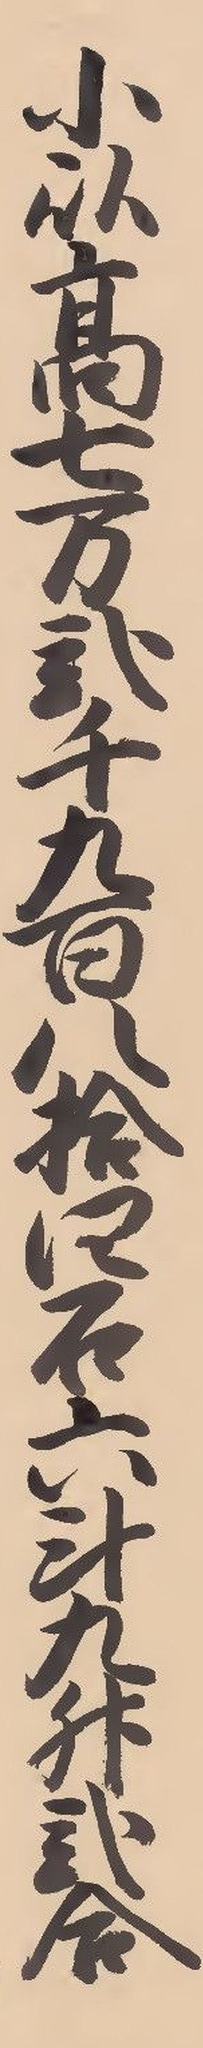小以髙七万弐千九百八拾四石六斗九升弐合
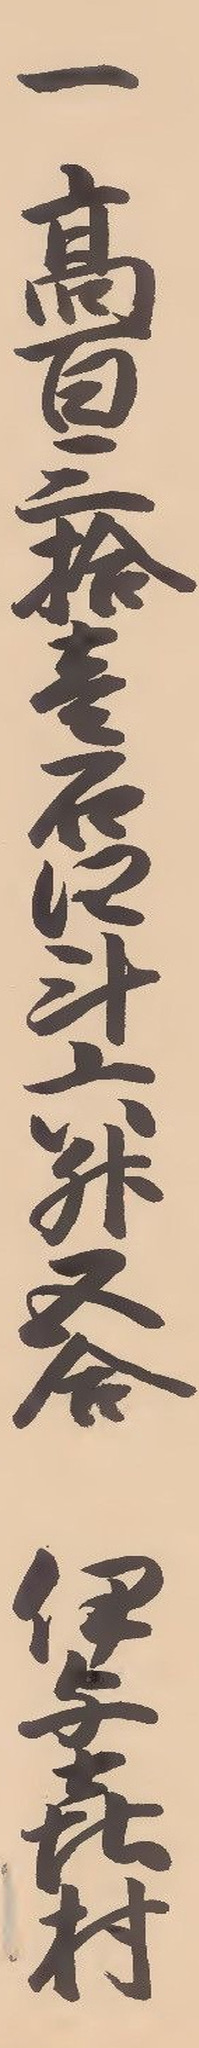一髙百三拾壱石四斗六升五合伊与喜村
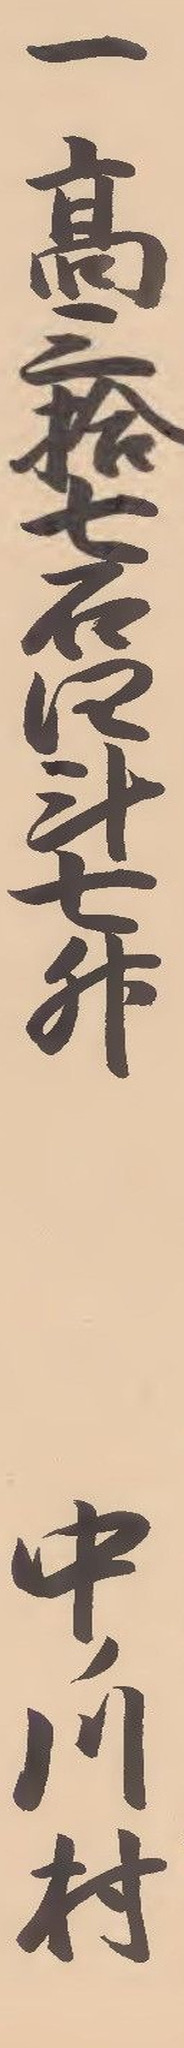一髙三拾七石四斗七升中ノ川村

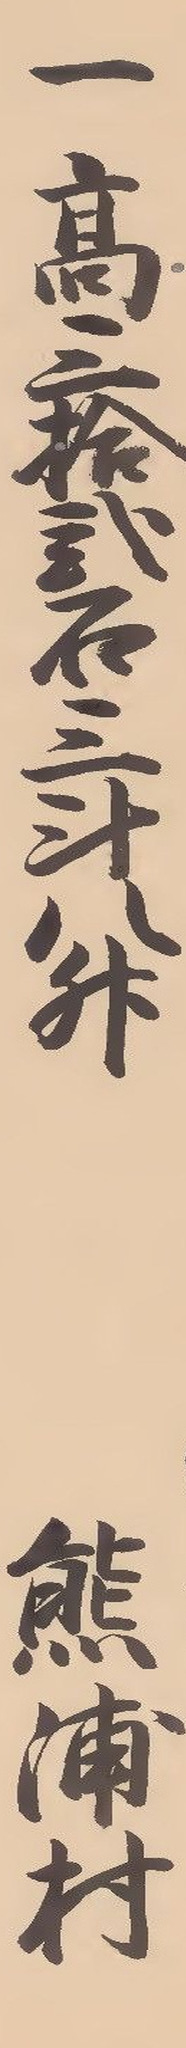一髙三拾弐石三斗八升熊浦村
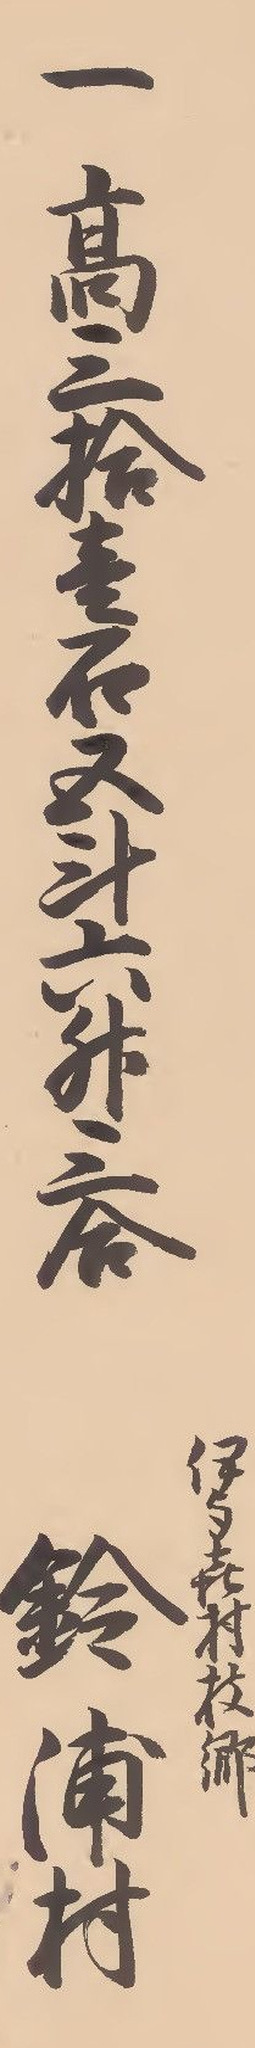一髙三拾壱石五斗六升三合鈴浦村
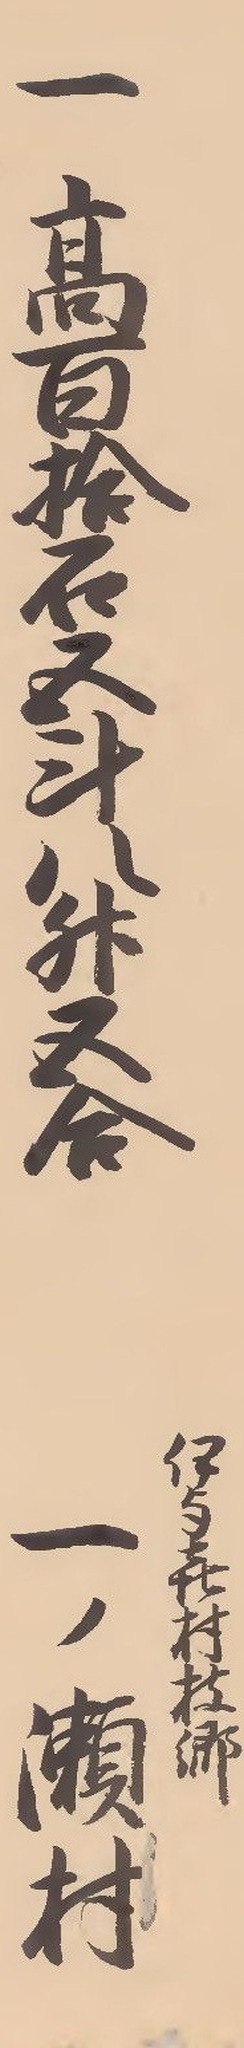一髙百拾石五斗八升五合一ノ瀬村
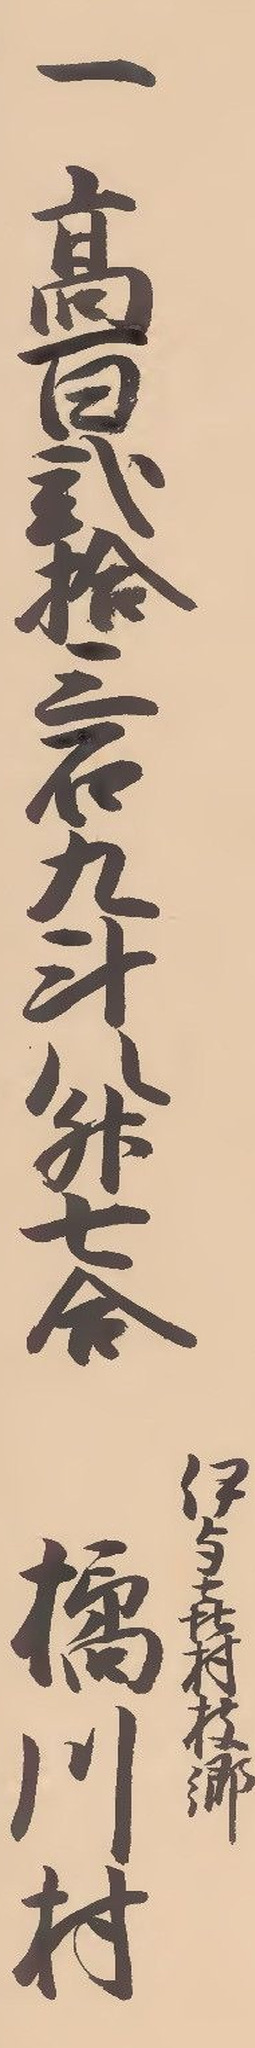一髙百弐拾三石九斗八升七合橘川村
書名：土佐国郷帳
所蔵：国立公文書館 National Archives of Japan
